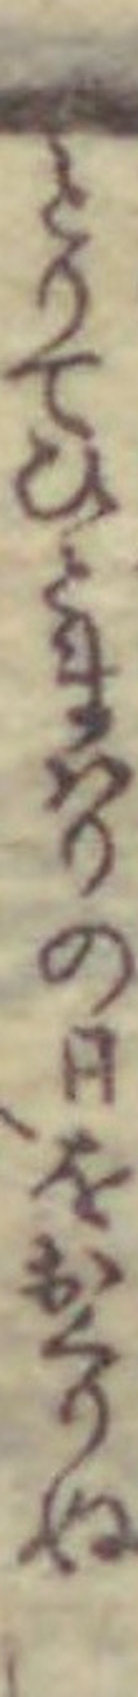とりてひとまはりの日をおくりぬ
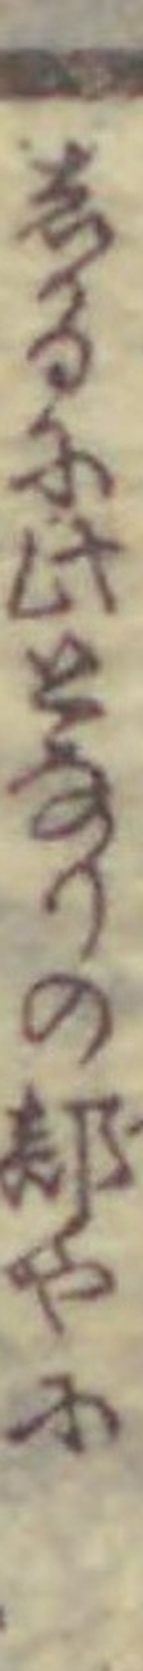しかるに此となりの部やに
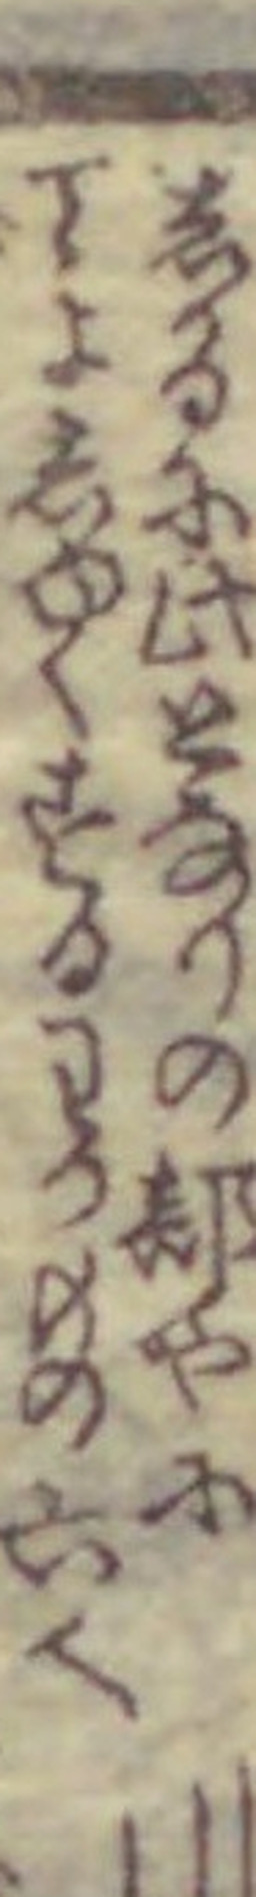てよしゆくするわかもの六人
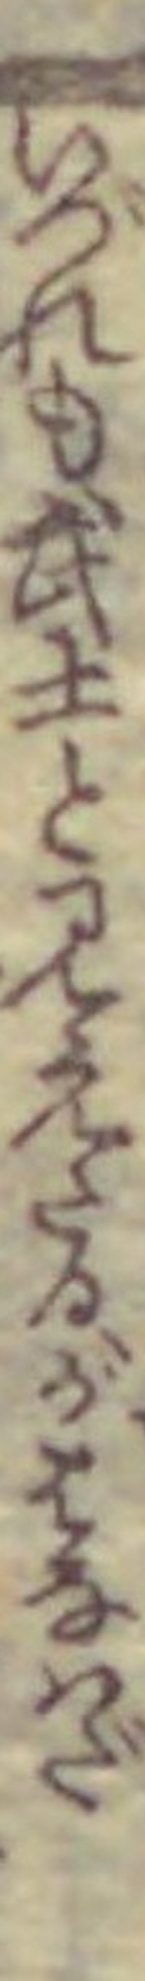いづれも武士と見えたるがはなはだ
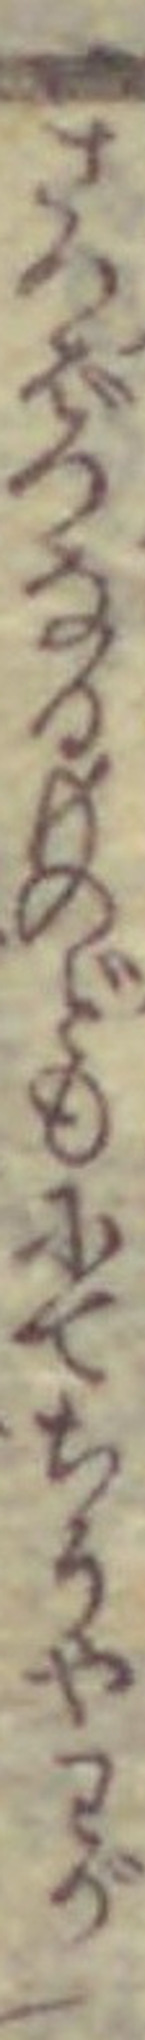さつばつなるものどもにてちうやわが
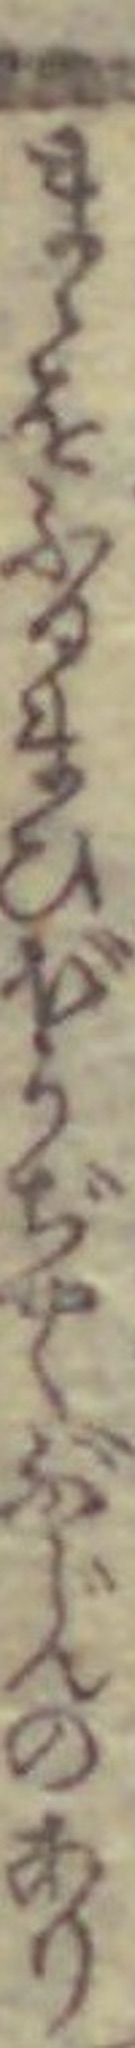まゝをふるまひぼうぢやくぶじんのあり
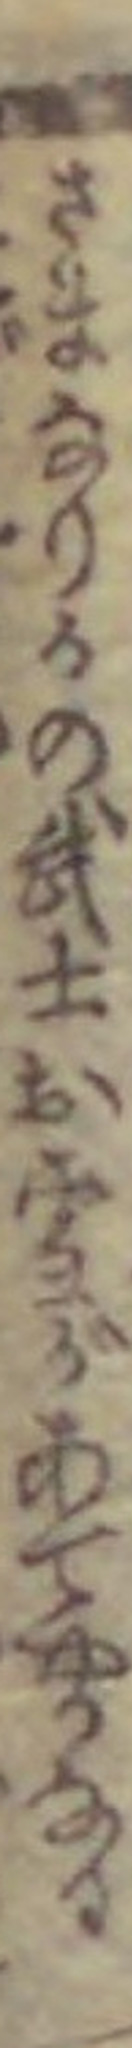さまなりかの武士お雪があてやかなる
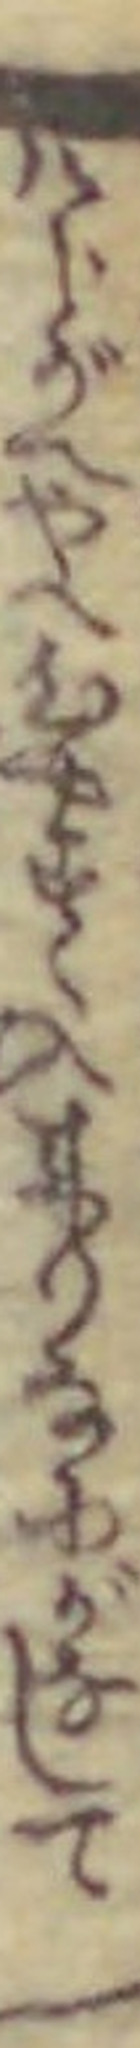八郎がへやへ心やすく入来りなにがなして
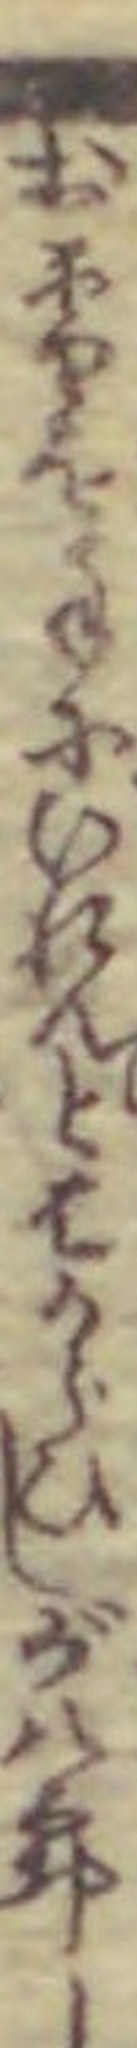お雪を手にいれんとはからひしが八郎
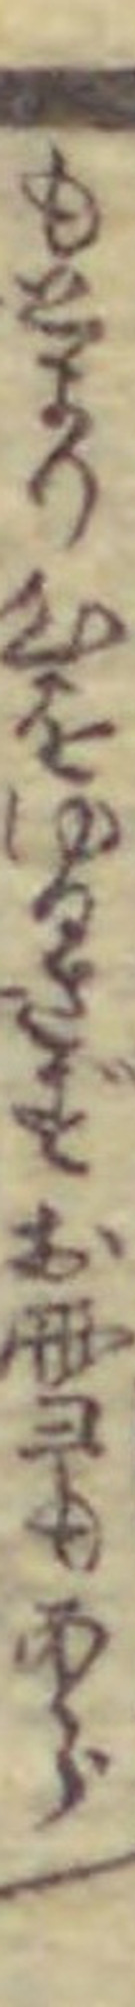もとより心をゆるさずお雪もあら
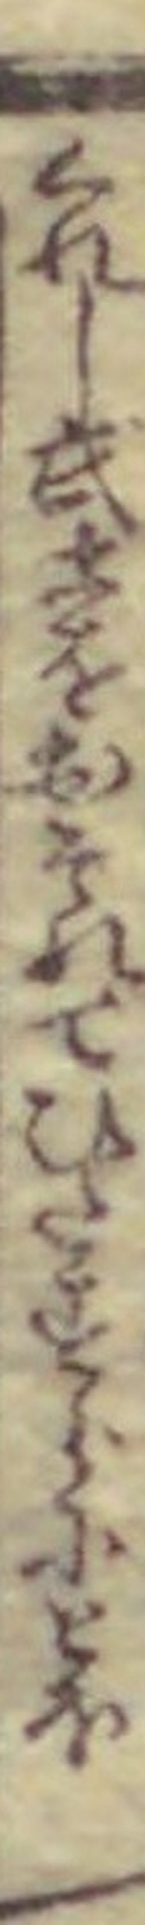くれし武士をおそれてひたすらにとほ
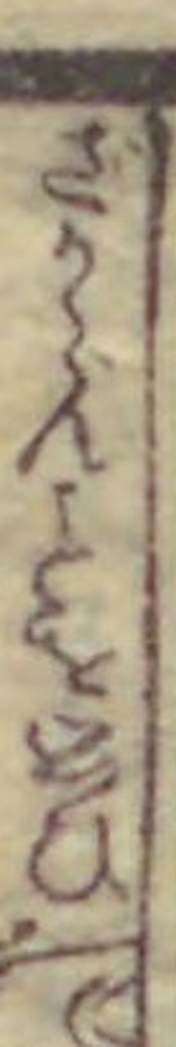ざからんことを思ひ
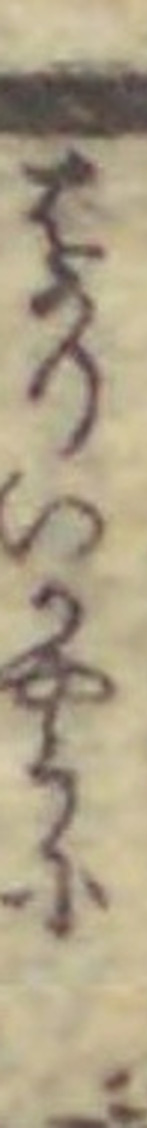はかりいかやうに
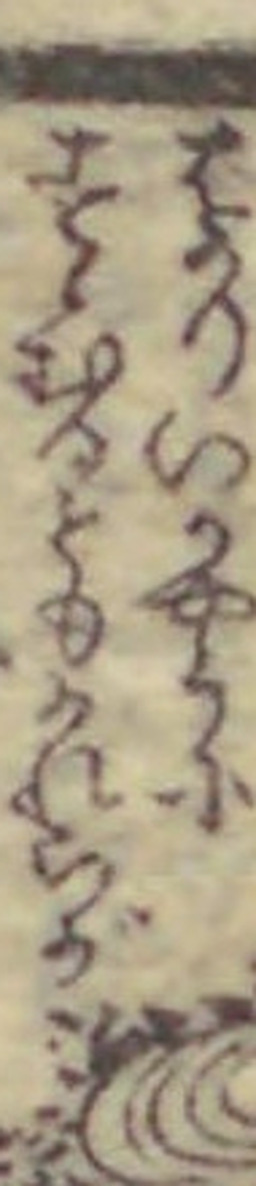すゝむるともかれらが
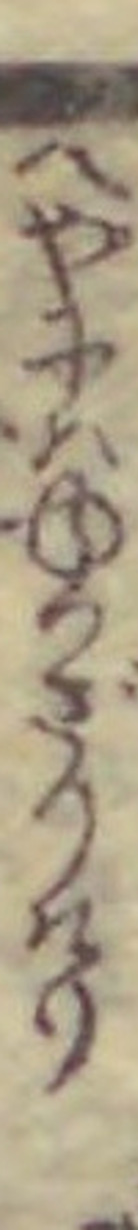へやにはゆかざりけり
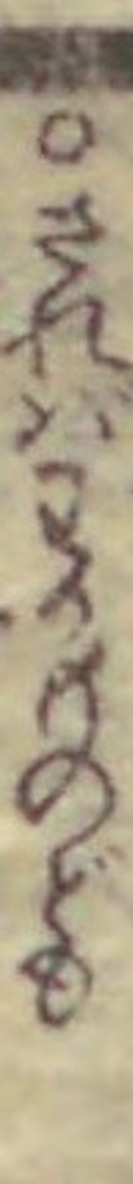○さればわかものども
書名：八ツ目鱣因縁物語 3巻
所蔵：国立国会図書館 National Diet Library, JAPAN
